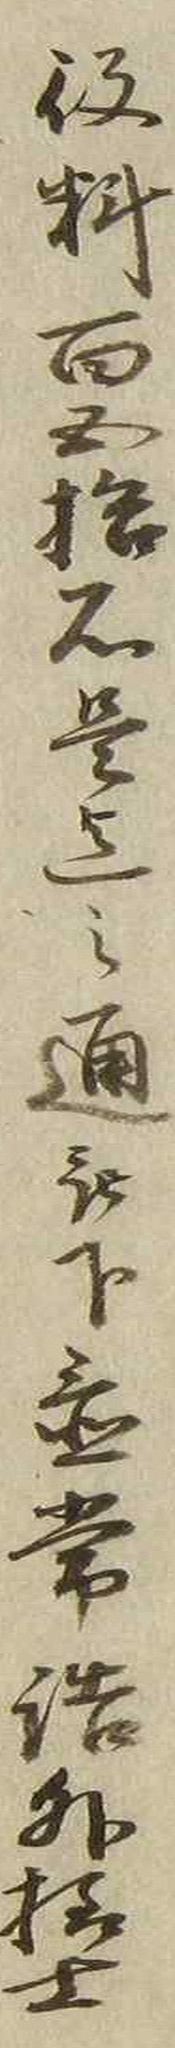役料百五拾石是迄之通被下置常詰外様士
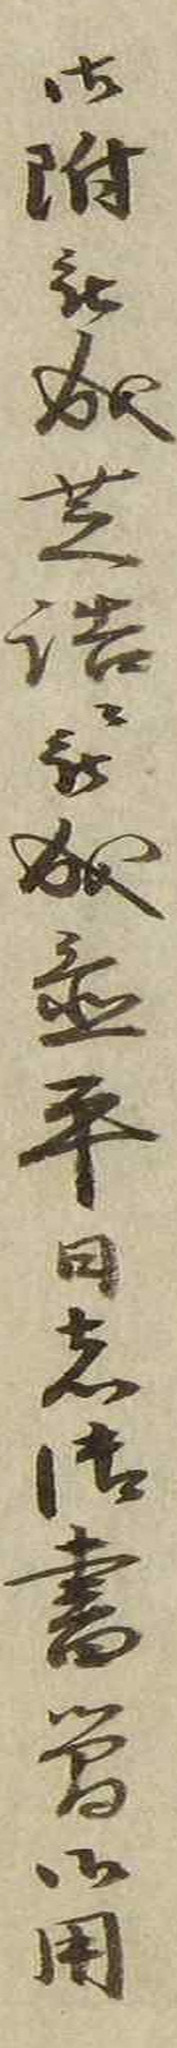御附被成芝詰に被成置平日は御書簡御用

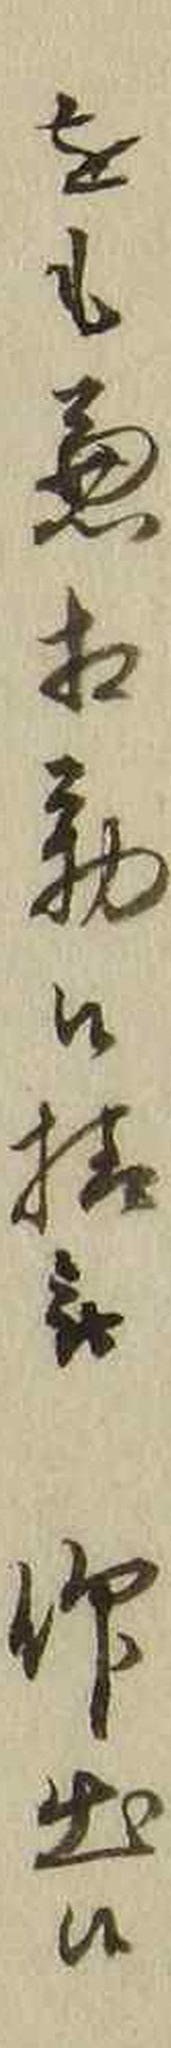をも相勤候様被仰出候
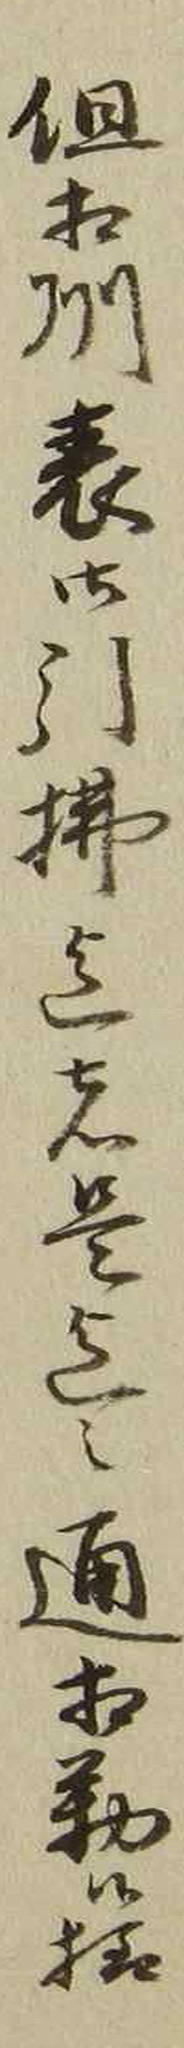但相州表御引払迄は是迄之通相勤候様
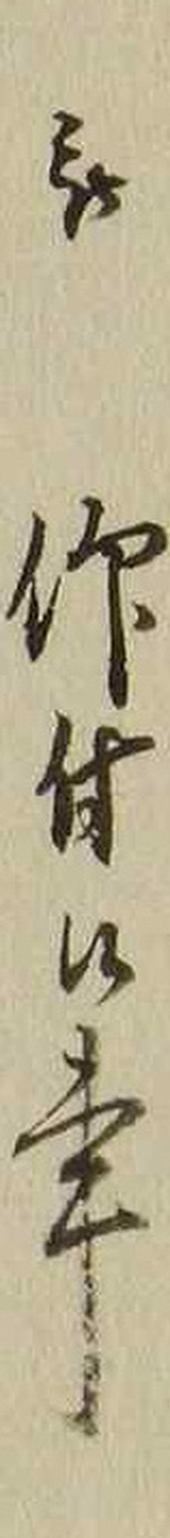被仰付候事
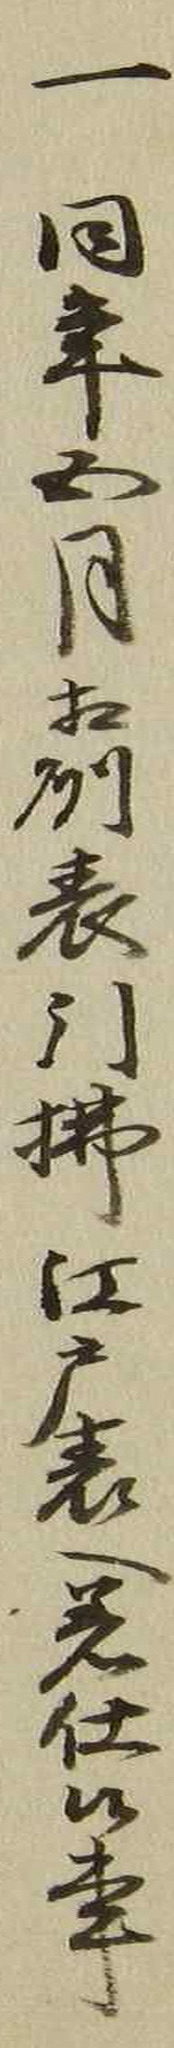一同年五月相州表引払江戸表へ着仕候事
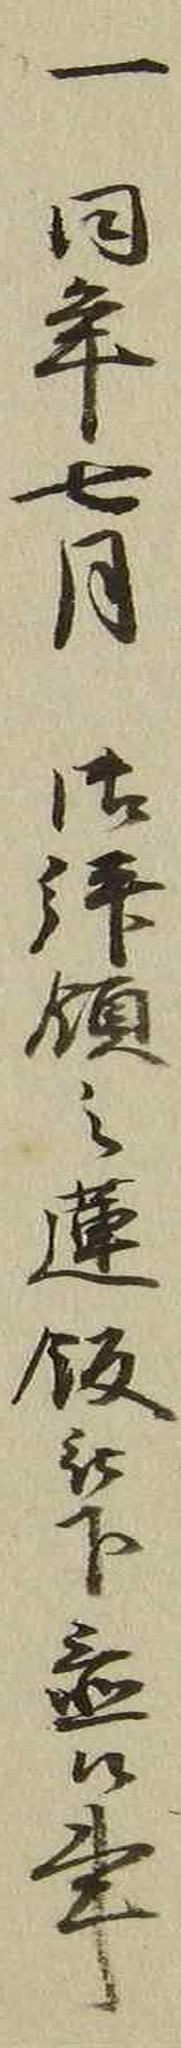一同年七月御拝領之蓮飯被下置候事
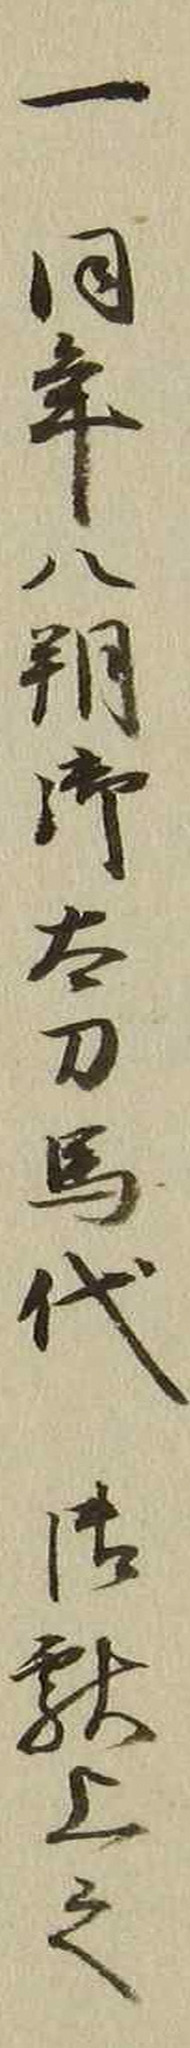一同年八朔御太刀馬代御献上之
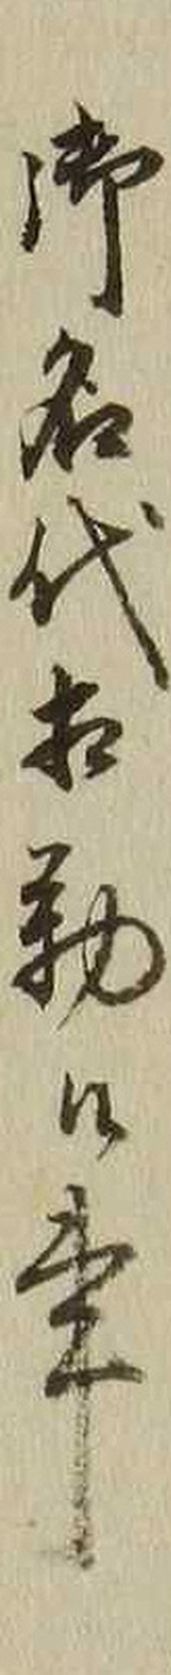御名代相勤候事
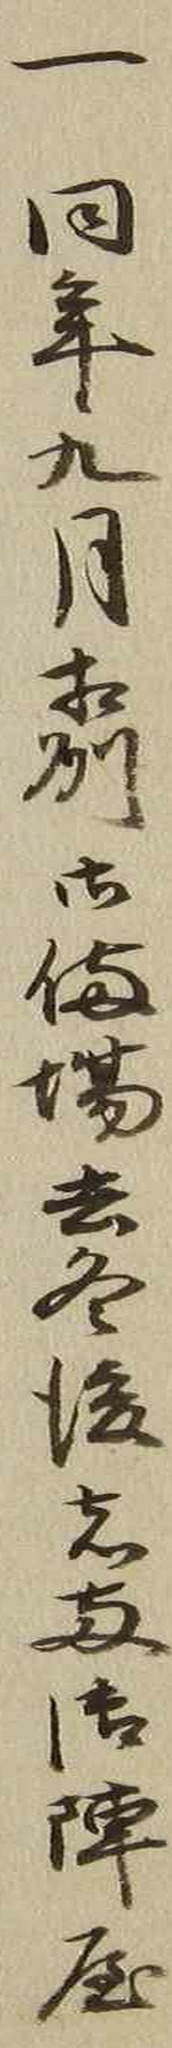一同年九月相州御備場去冬後は両御陣屋
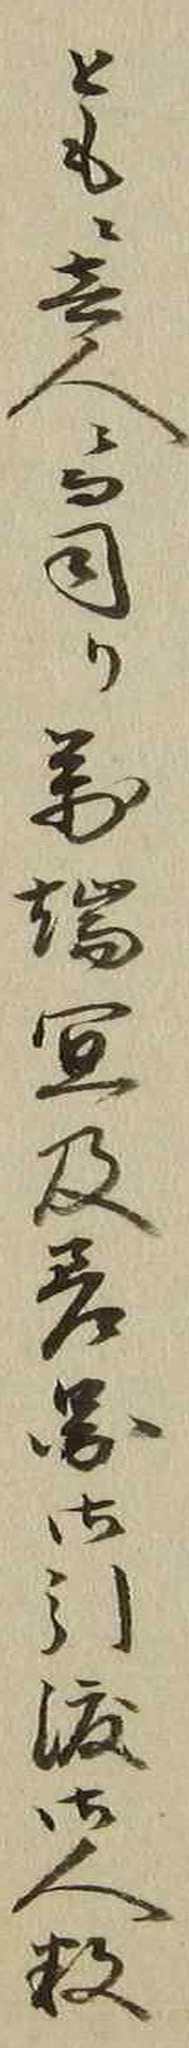ともに壱人に而司り万端宜及差図御引渡御人数
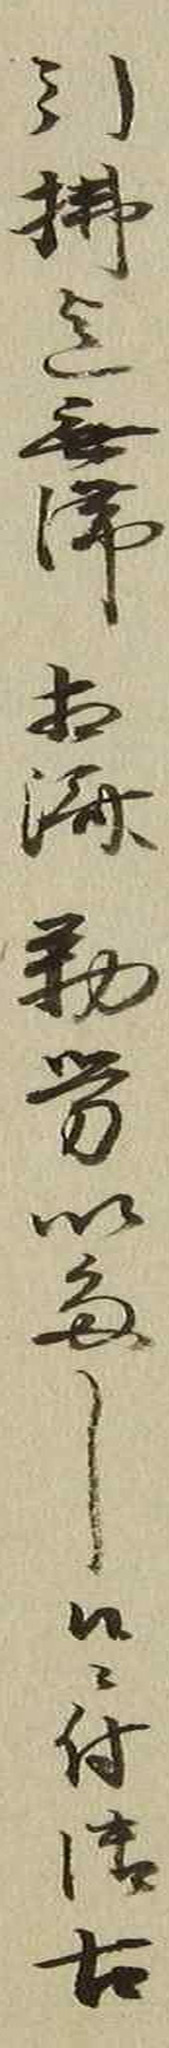引払迄無滞相済勤労いたし候に付御古
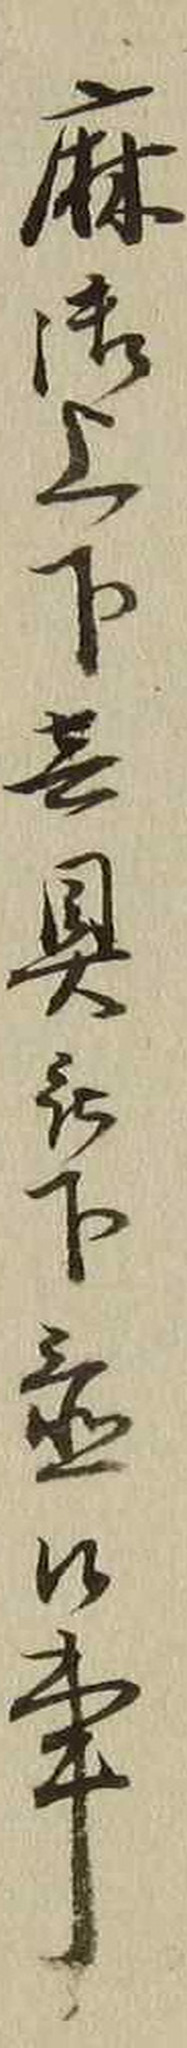麻御上下壱具被下置候事
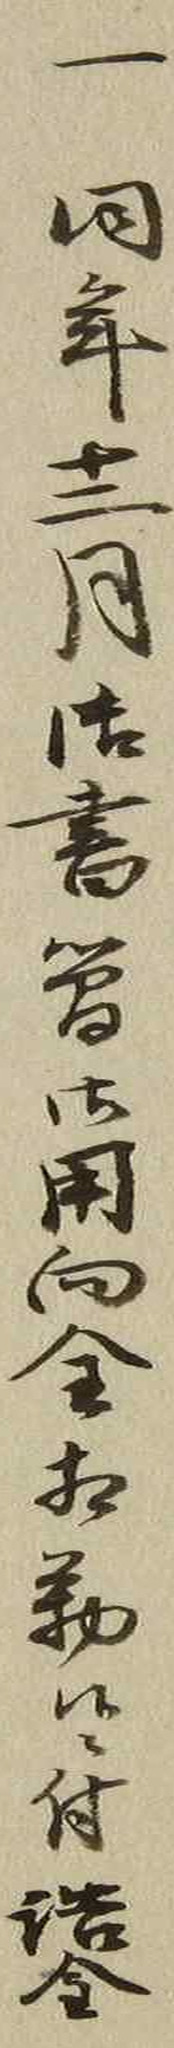一同年三月御書簡御用向全相勤候に付詰金
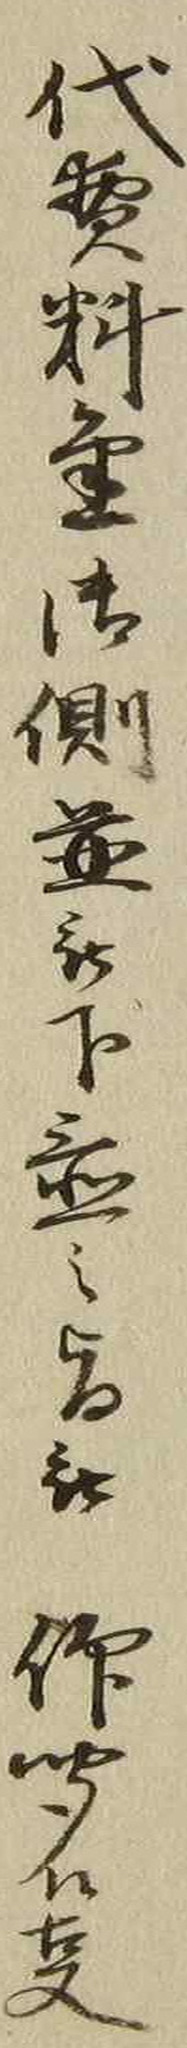代費料金御側並被下置之旨被仰聞候事
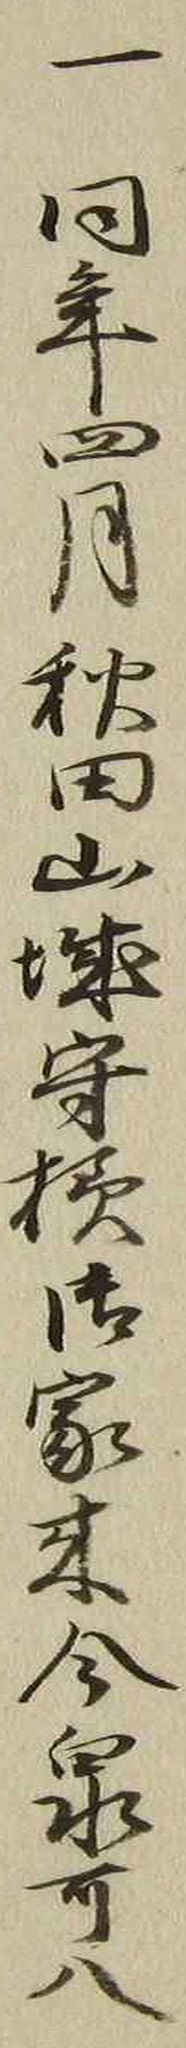一同年四月秋田山城守様御家来今泉可八
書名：諸士系譜　巻之133　た之部9
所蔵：会津若松市立会津図書館
